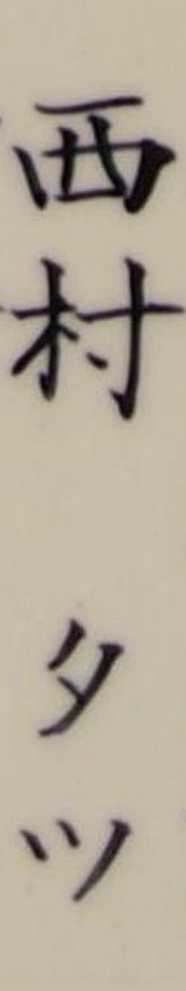西村タツ
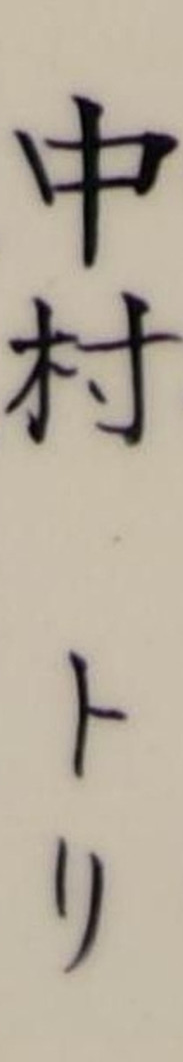中村トリ
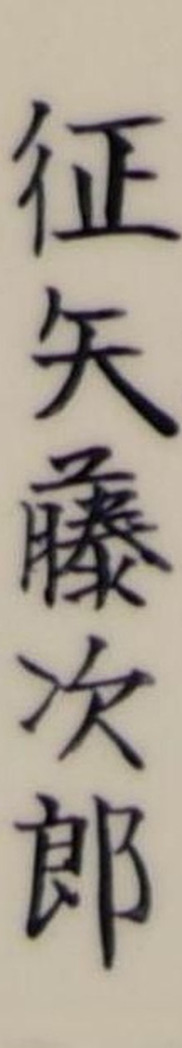征矢藤次郎
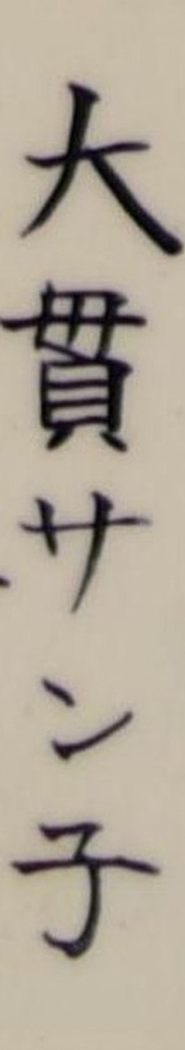大貫サン子
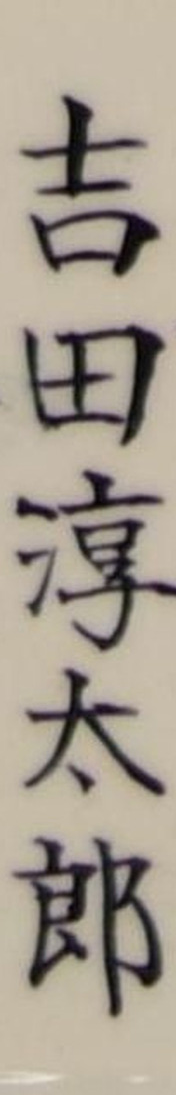吉田淳太郎
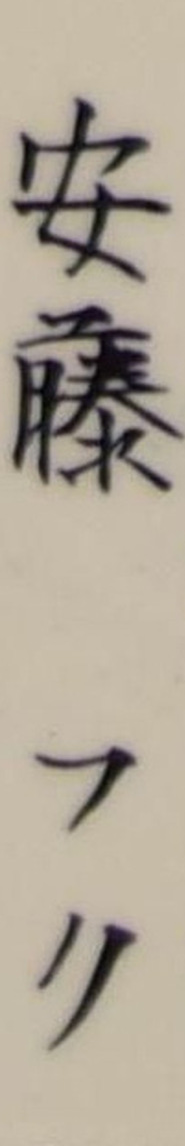安藤フク
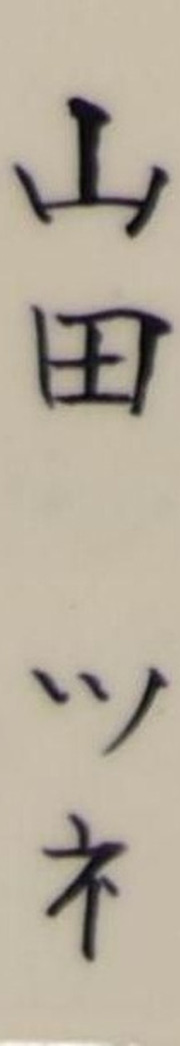山田ツネ
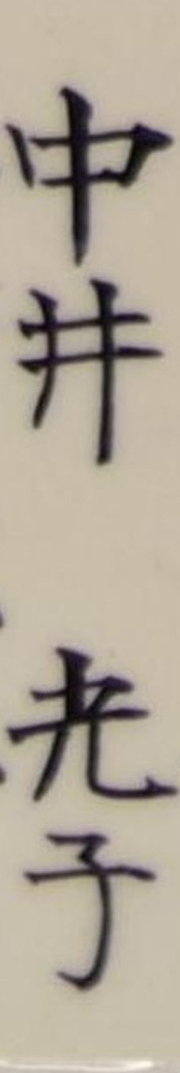中井光子
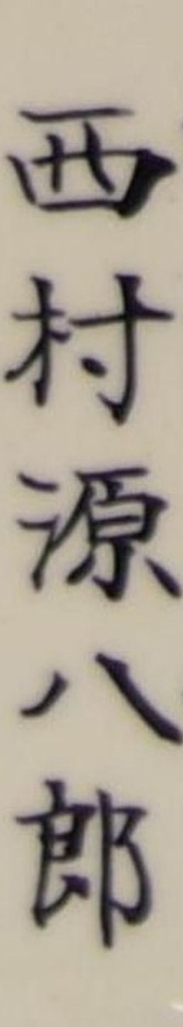西村源八郎
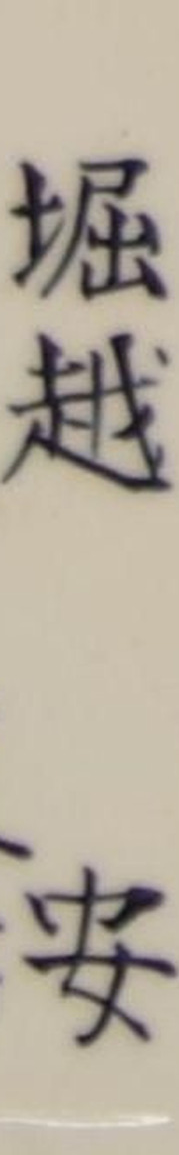堀越安
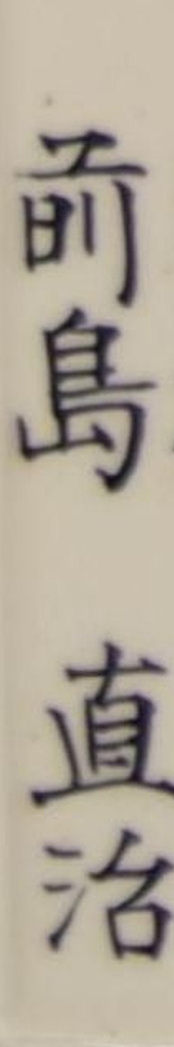前島直治

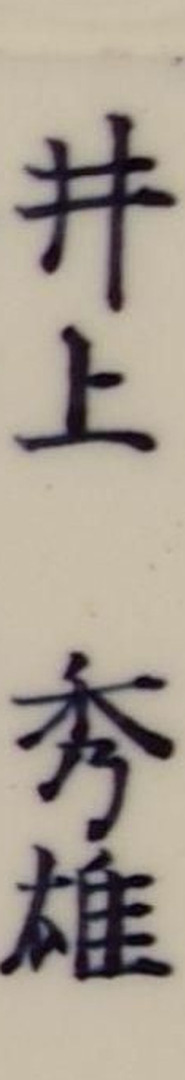井上秀雄
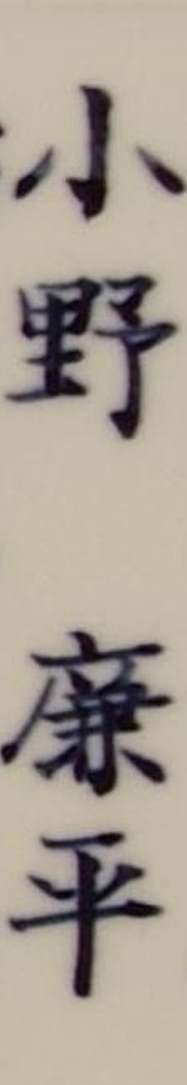小野廉平
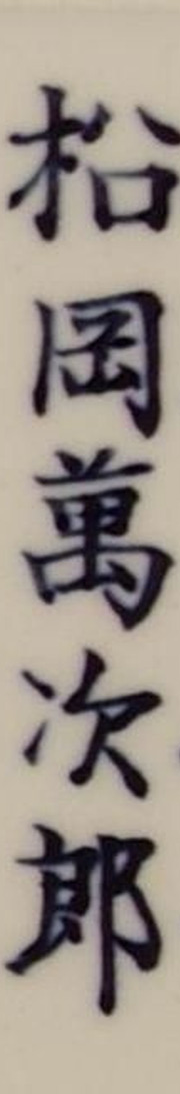松岡萬次郎
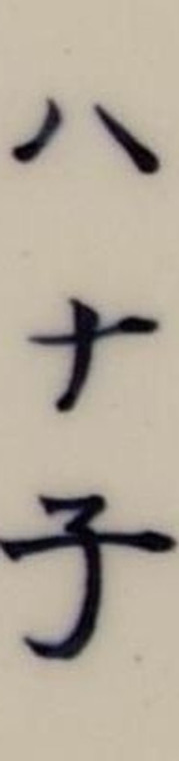ハナ子
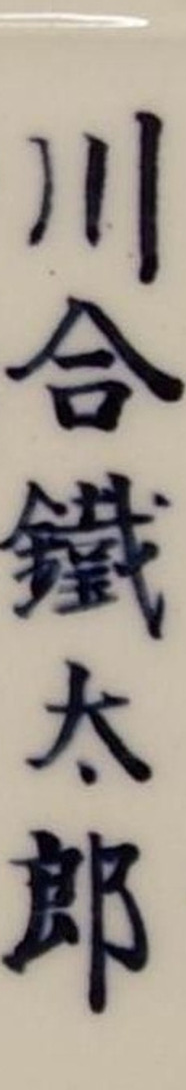川合鐵太郎
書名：M~S
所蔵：高野山金剛峯寺
